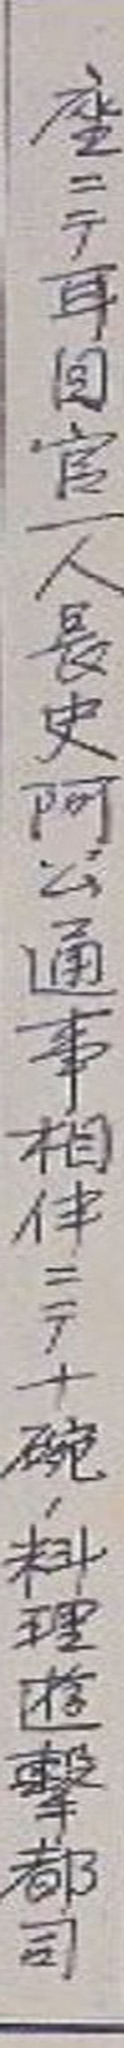座にて耳目官一人長史阿公通事相伴にて十碗の料理遊撃都司
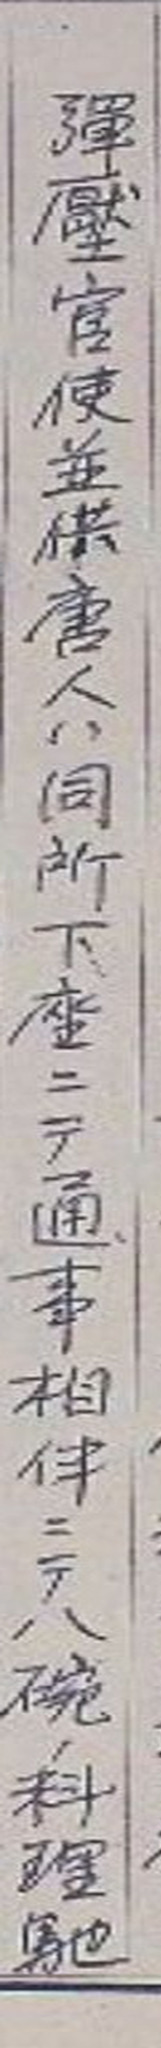弾圧官使並供唐人は同所下座にて通事相伴にて八碗の料理馳
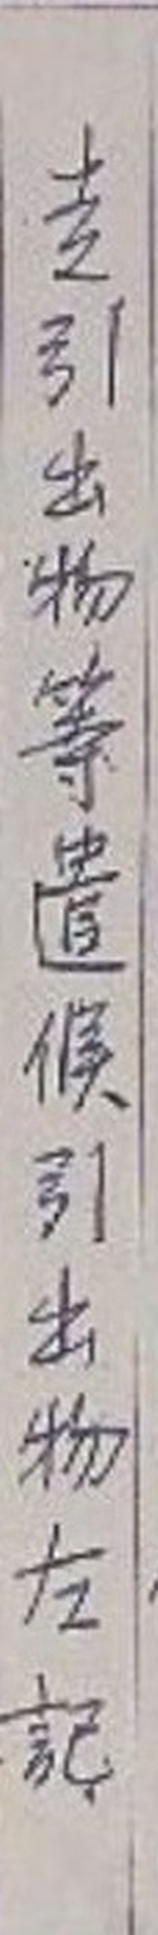走引出物等遣候引出物左記
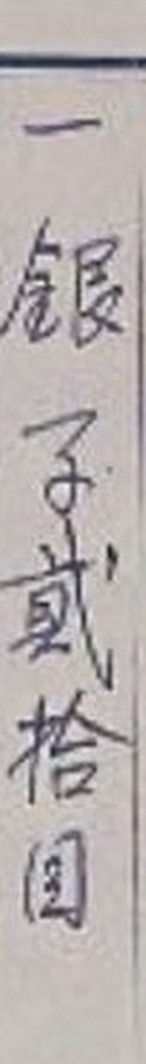一銀子弐拾目
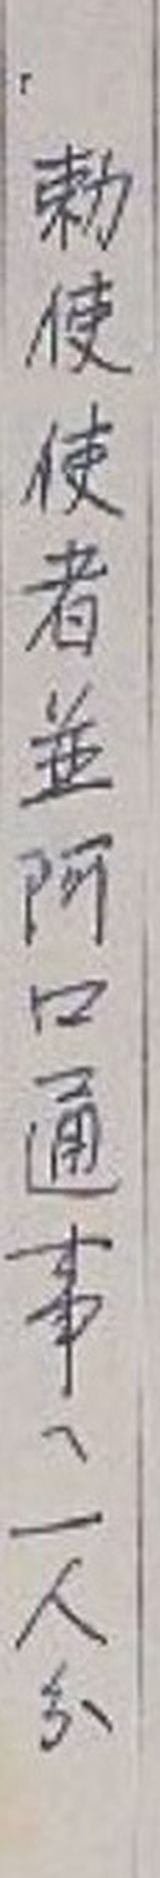勅使使者並阿口通事へ一人分
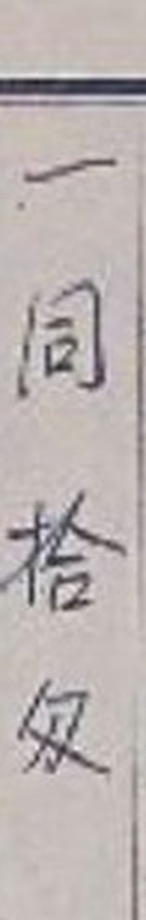一同拾匁
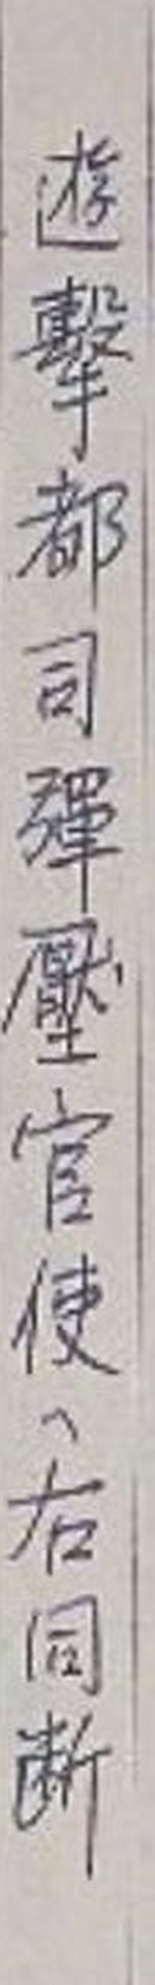遊撃都司弾圧官使へ右同断
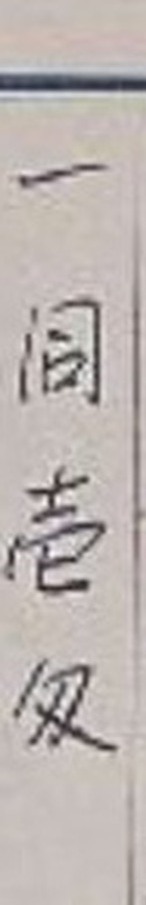一同壱匁
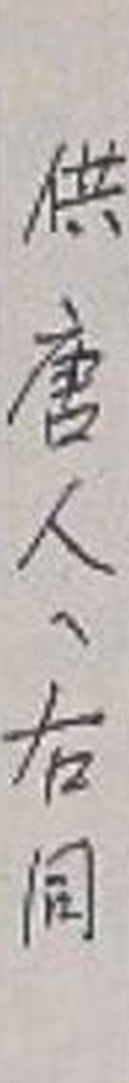供唐人へ右同
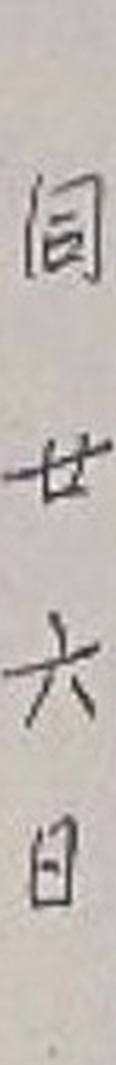同廿六日
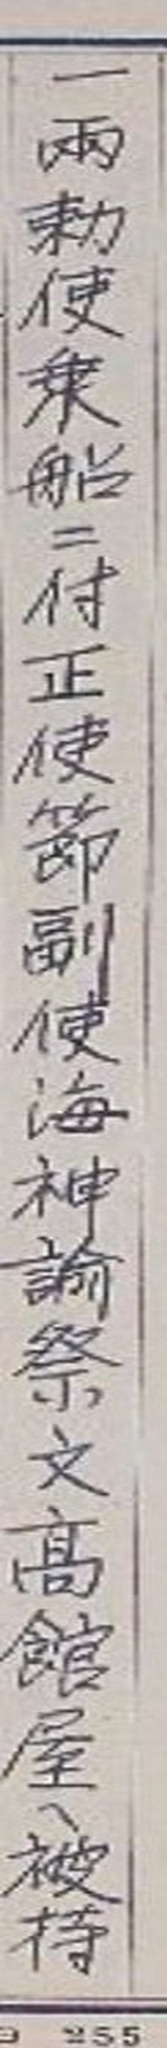一両勅使乗船に付正使節副使海神諭祭文高館屋へ被持
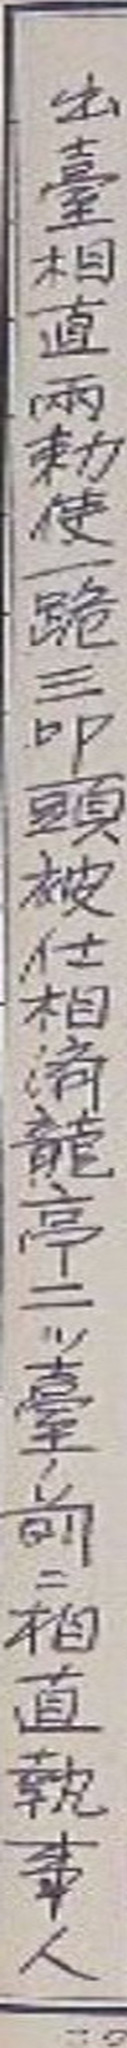出台相直両勅使一跪三叩頭被仕相済龍亭二つ台の前に相直執事人
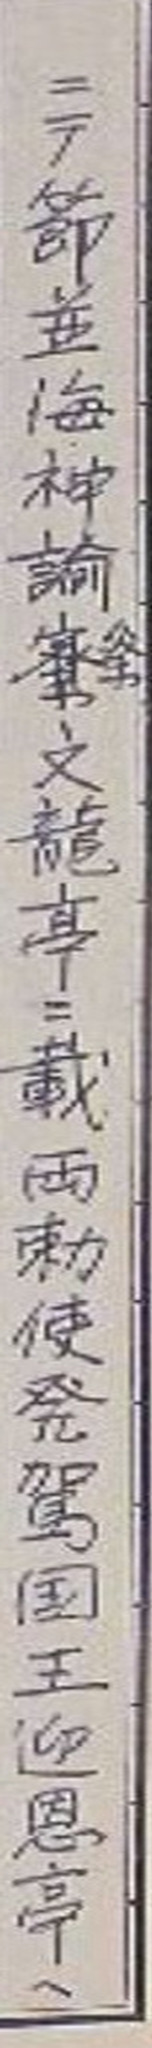にて節並海神諭祭文龍亭に載両勅使発駕国王迎恩亭へ
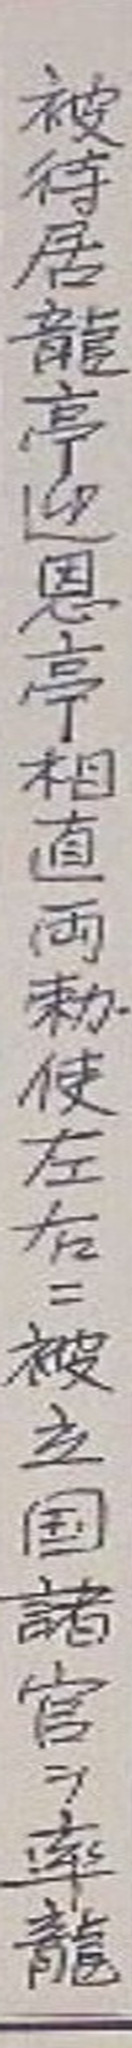被待居龍亭迎恩亭相直両勅使左右に被立国諸官を率龍
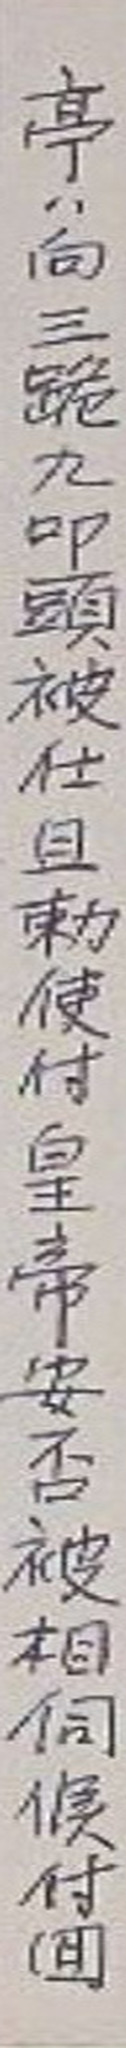亭は向三跪九叩頭被仕且勅使付皇帝安否被相伺候付回
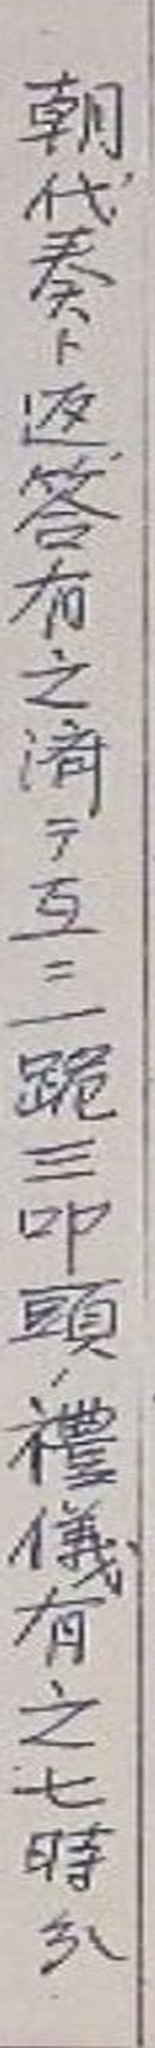朝代奏と返答有之済て互に一跪三叩頭の礼儀有之七時分
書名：支那冊封使来琉諸記 下巻
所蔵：University of the Ryukyus Library
